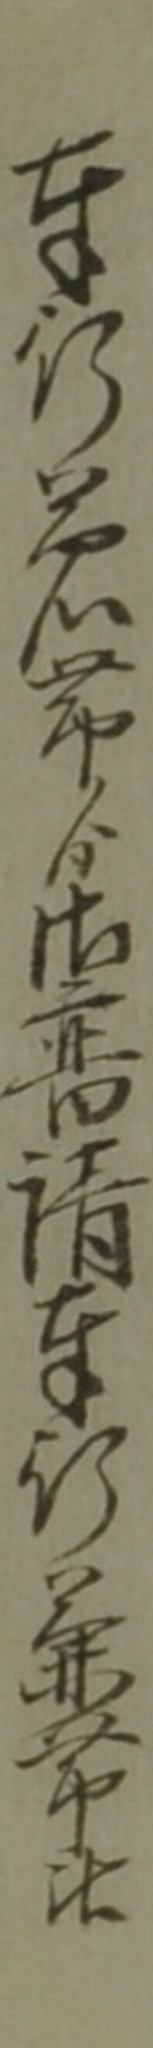奉行兼帯ゟ御普請奉行兼帯被
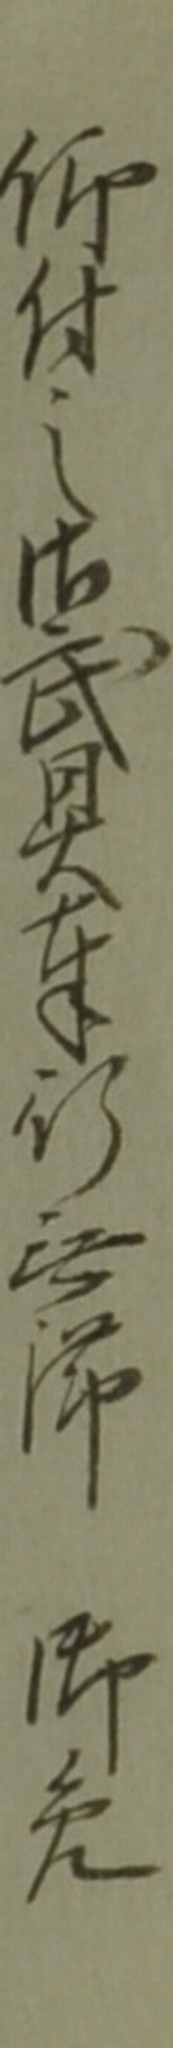仰付之御武具奉行無滞御免
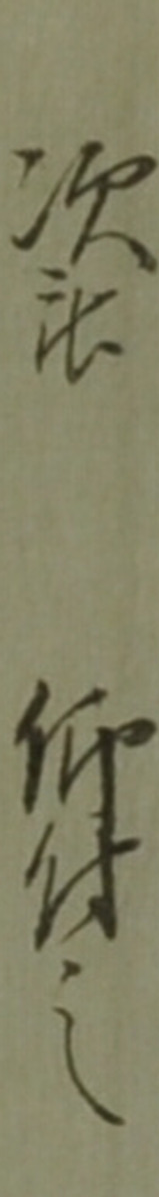次被仰付之
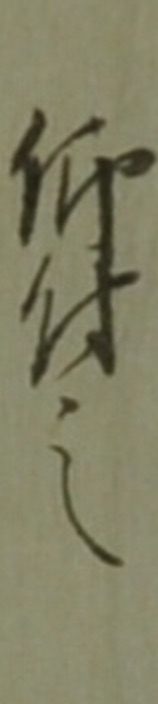仰付之
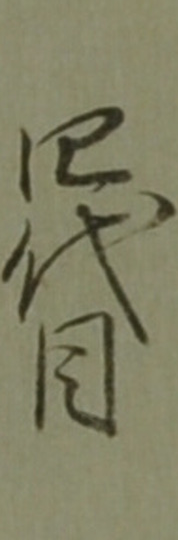四代目
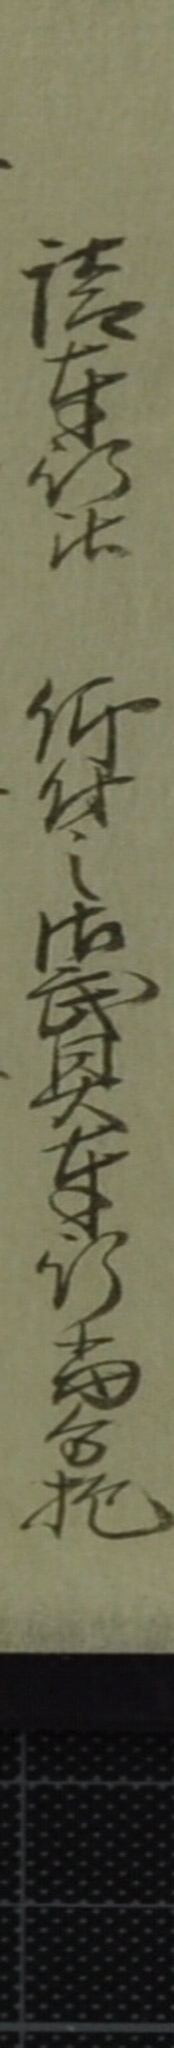請奉行被仰付之御武具奉行当分抱
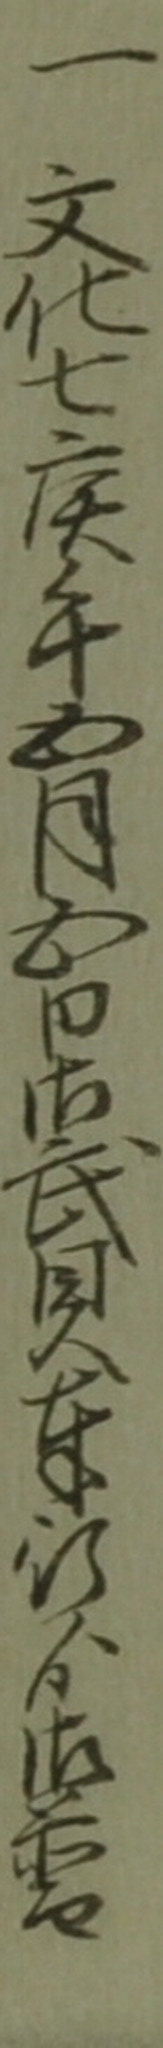一文化七庚午五月五日御武具奉行ゟ御普
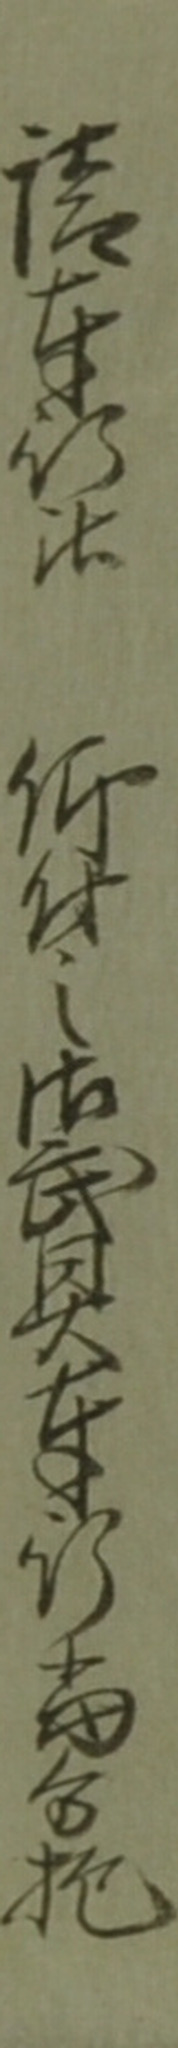請奉行被仰付之御武具奉行当分抱
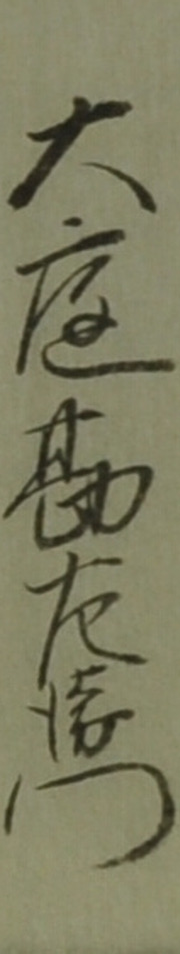大庭勘左衛門
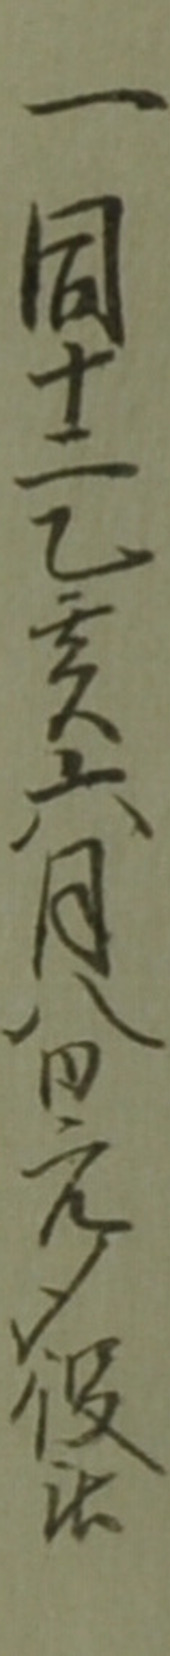一同十二乙亥六月八日元〆役被
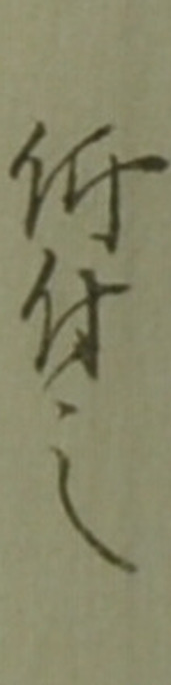仰付之

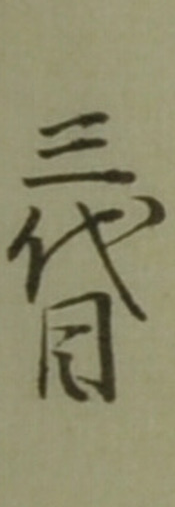三代目
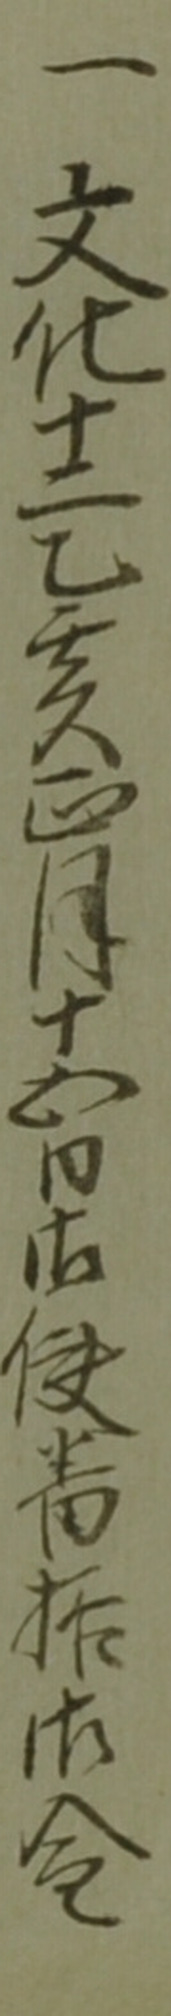一文化十二乙亥正月十五日御使番格御金
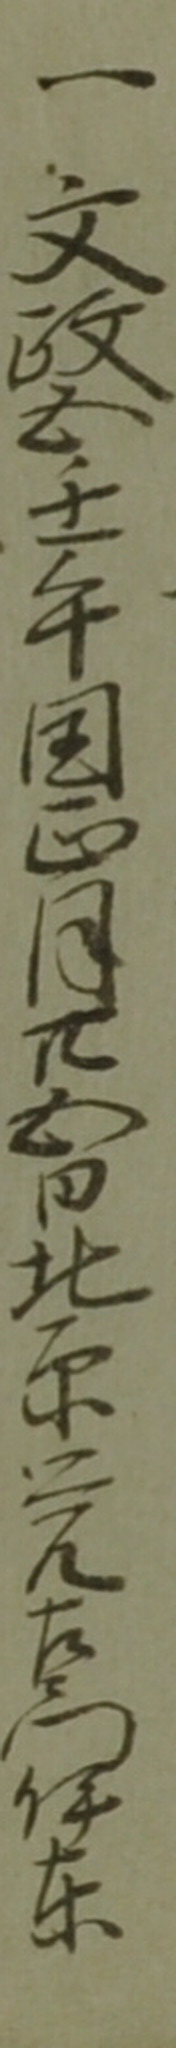一文政五壬午閏正月廿五日北原覚左衛門伊東
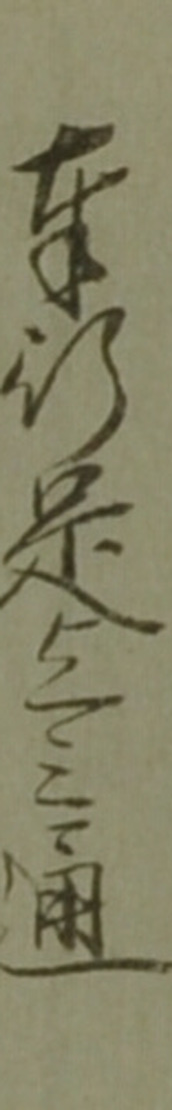奉行是迄之通
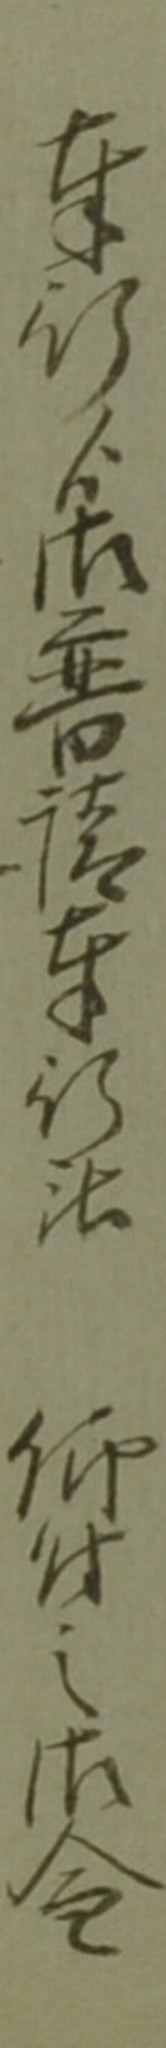奉行ゟ御普請奉行被仰付之御金
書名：諸御役代々録（六）
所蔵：伊那市立高遠町図書館・合同会社AMANE
